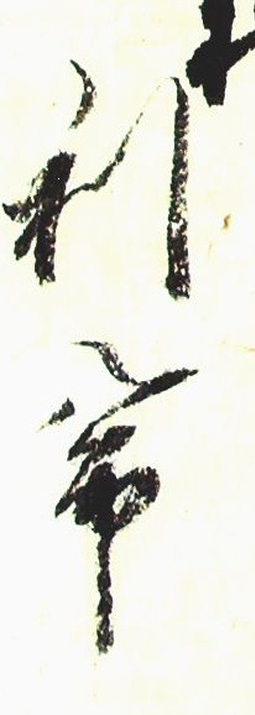利八郎
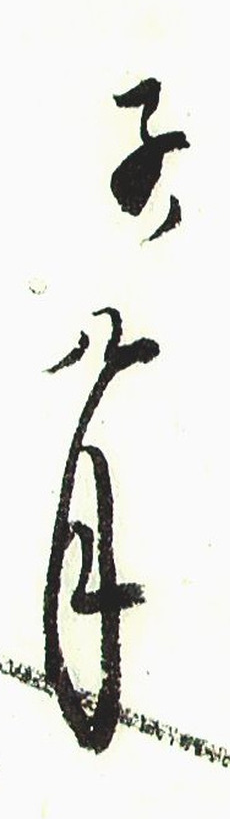子八月

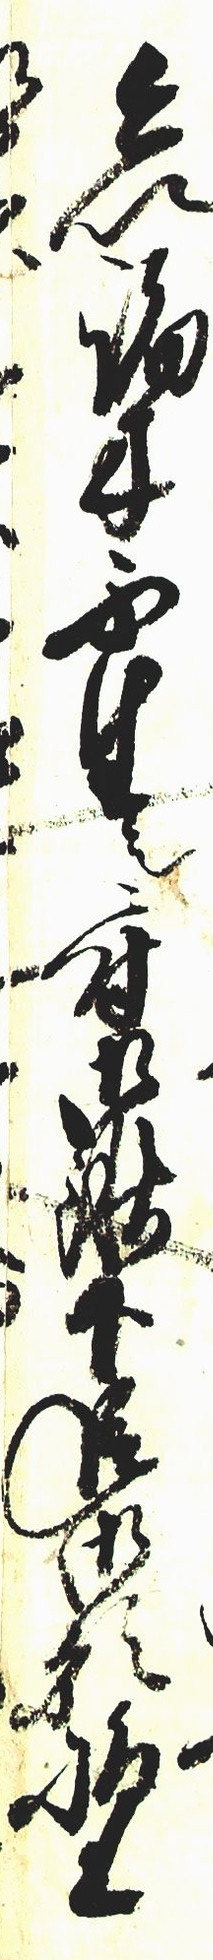今以諸木不生しに付御鍬下追御願指上
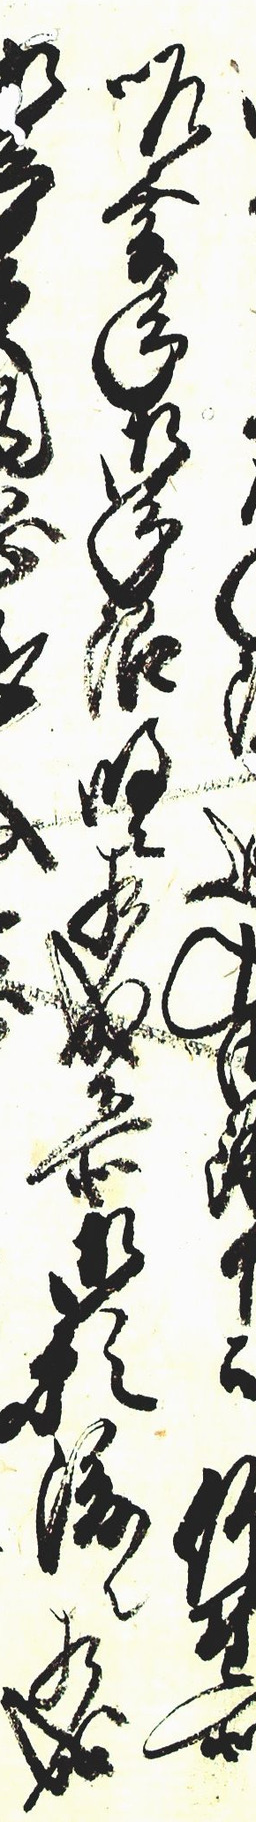昨亥年御年限明に相成候所御願後に相成
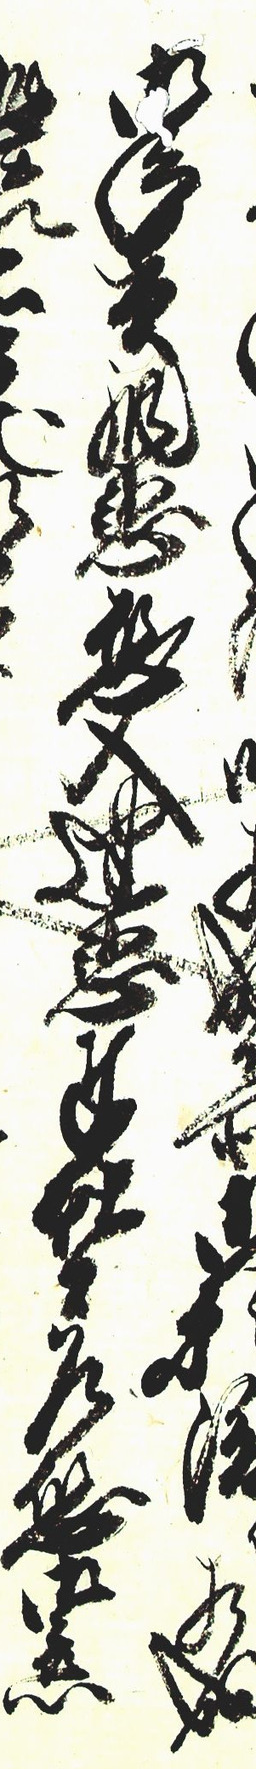御年貢調惑恐入迷惑奉仕候乍恐御慈
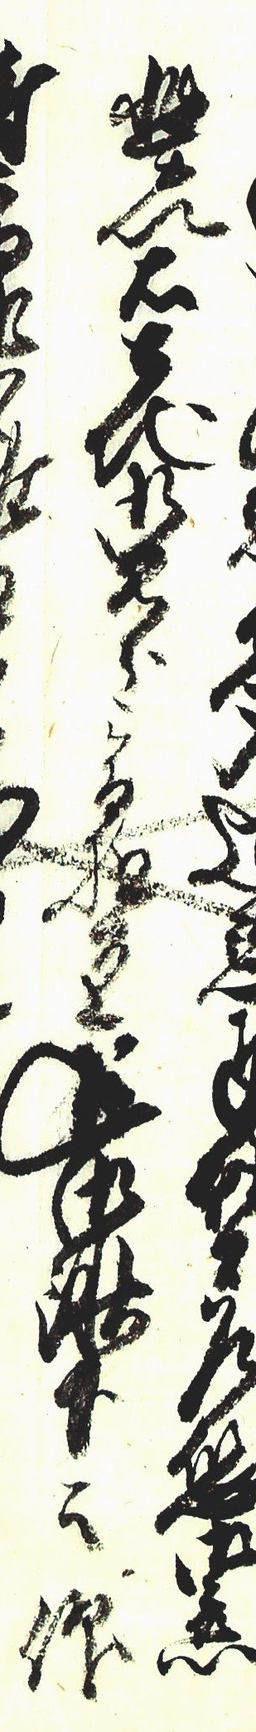悲を以右土地御見分被為遊候上追御鍬下被仰
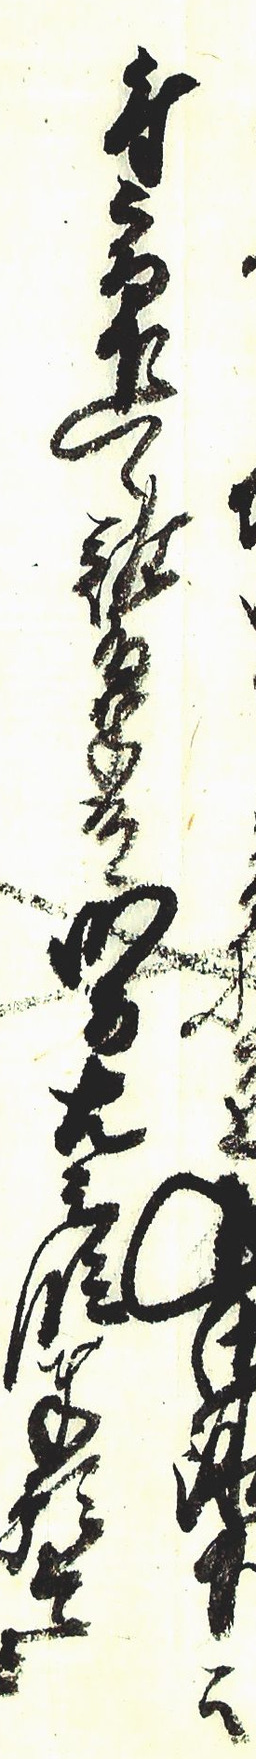付被為下候はゝ難有奉存候仍て右之段奉願上候以上
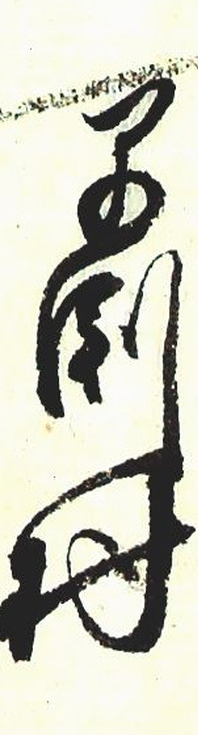早淵村
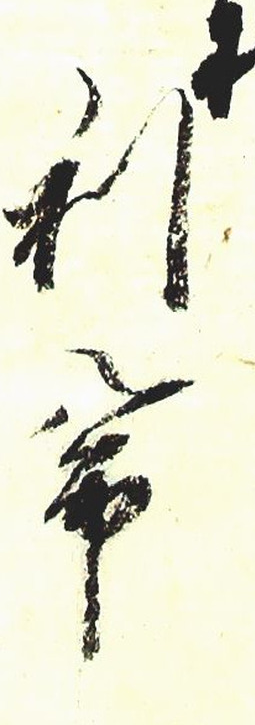利八郎
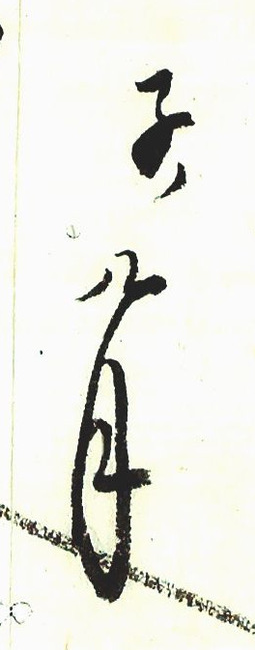子八月
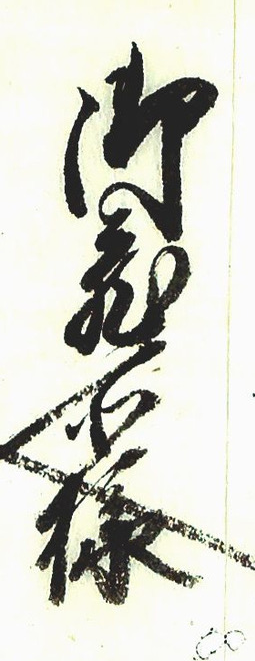御蔵所様
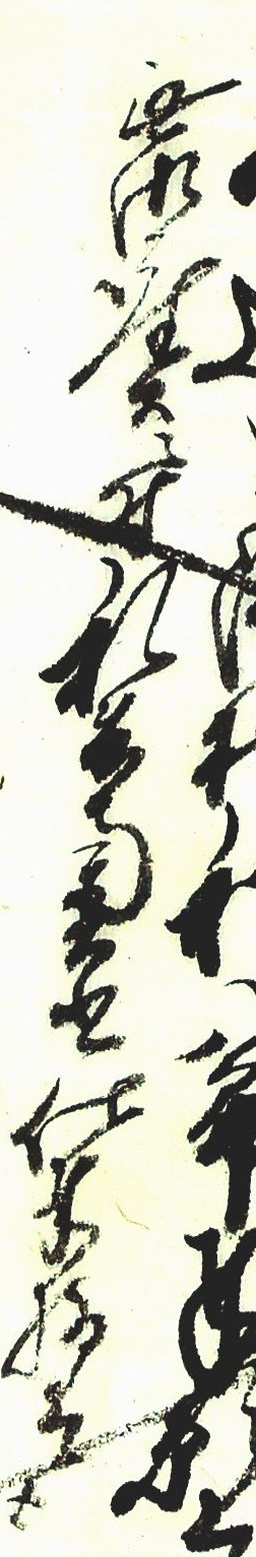無御座候に付私共奥書仕奉指上候以上
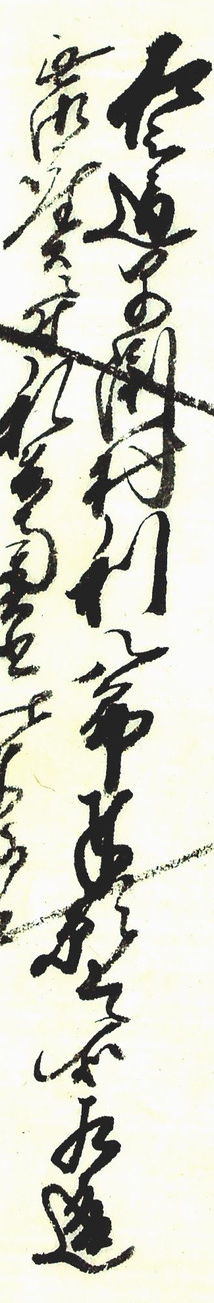右之通早淵村利八郎奉上候所相違
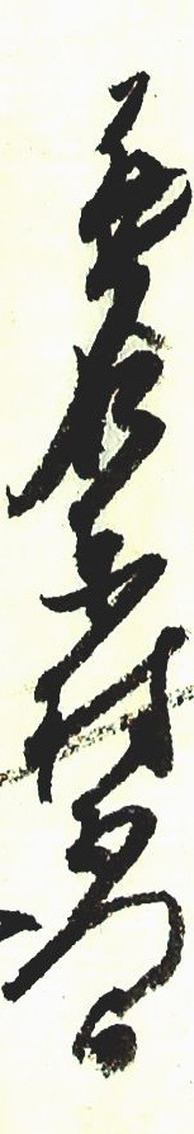西名東村五人与
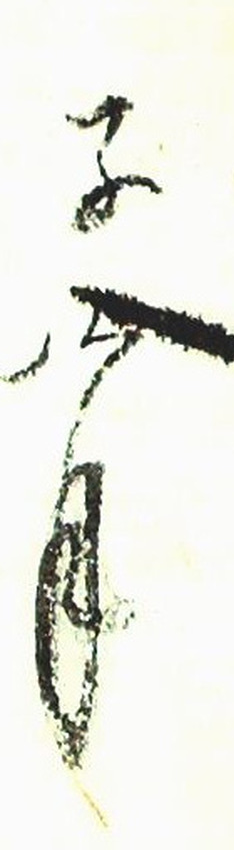子八月
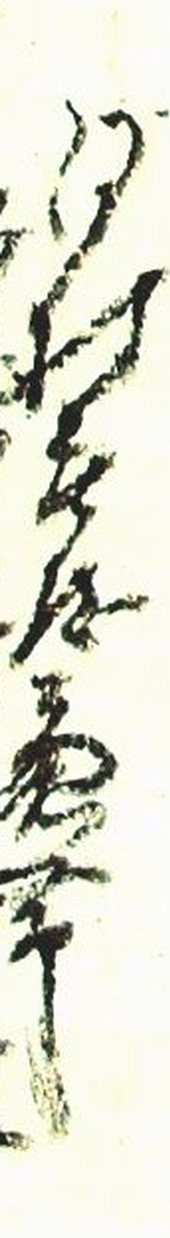同村庄屋兼帯
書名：諸御願書控(弐番）
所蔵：鳴門教育大学 Naruto University of Education
